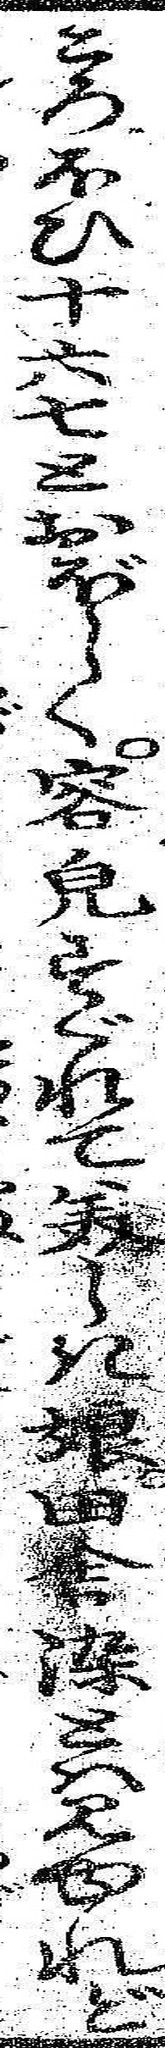ころほひ十六七とおぼしく。容貌すぐれて美しき娘。田舎染とは見ゆれど。
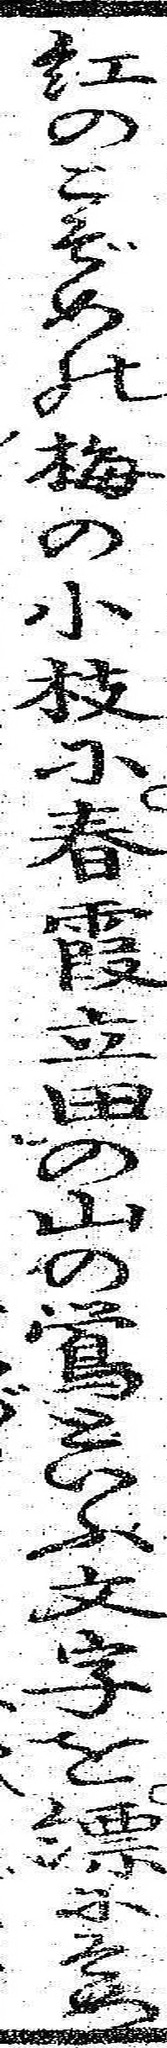紅のこぞめの梅の小枝に。春霞立田の山の鴬といふ文字を。縹にそめ
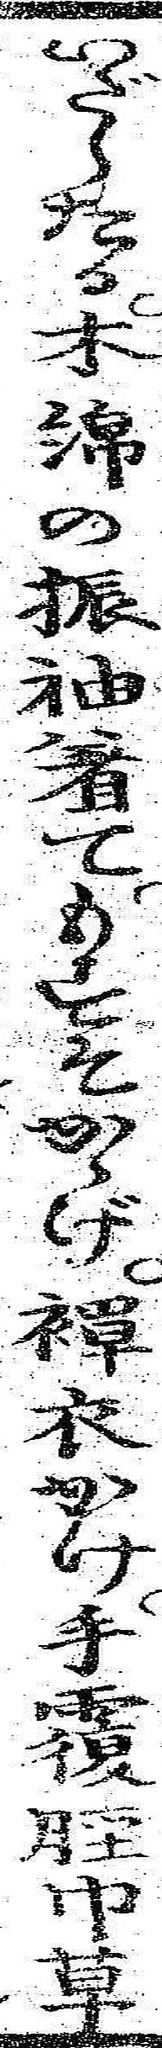いだしたる。木綿の振袖着て。もすそかゝげ。褌衣かけ。手覆脛巾草
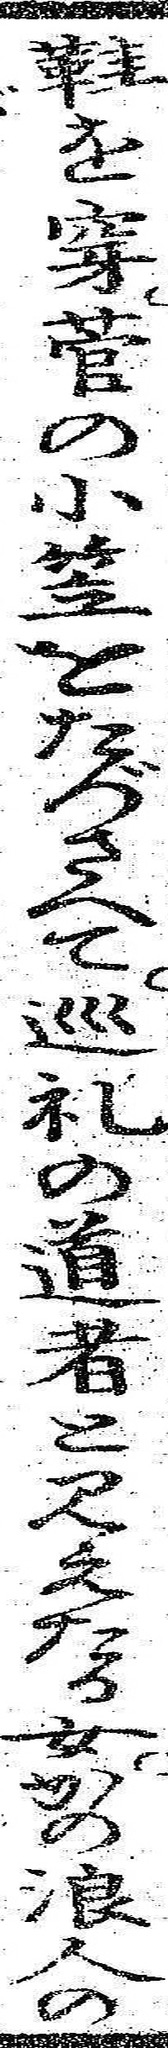鞋を穿。菅の小笠をたづさへて。巡礼の道者と見えたる女。かの浪人の
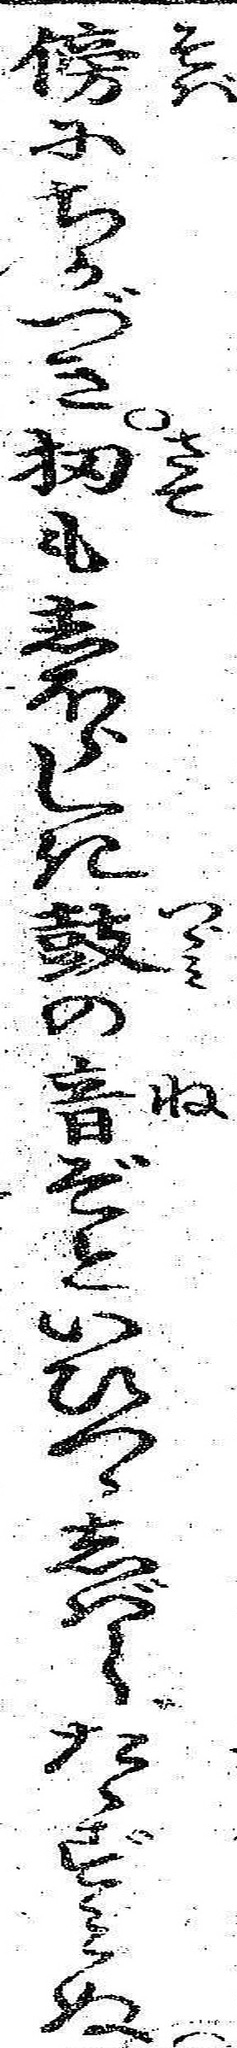傍にちかづき。扨もしほらしき鼓の音ぞといひつゝしばしたゝずみぬ。
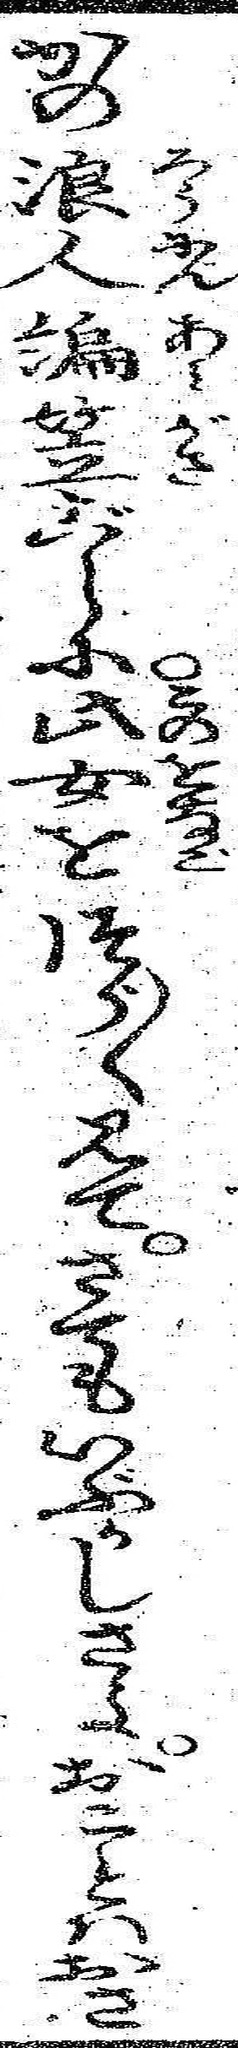かの浪人編笠ごしに。此女をつら〳〵見て。さてもいぶかしさよ。おことはおさ
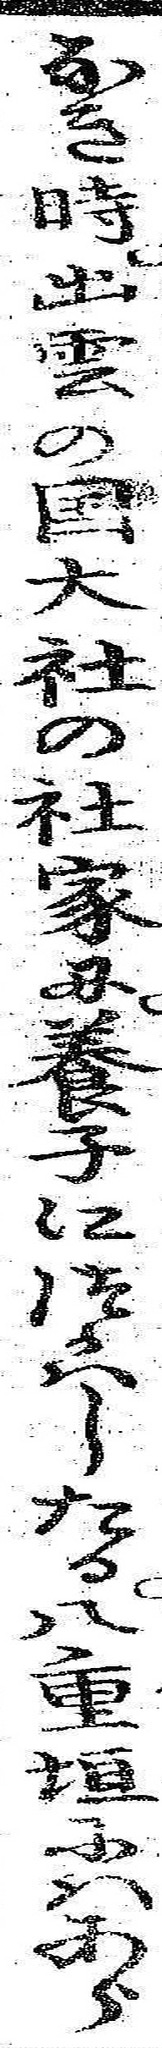なき時。出雲の国大社の社家に。養子につかはしたる。八重垣にはあら
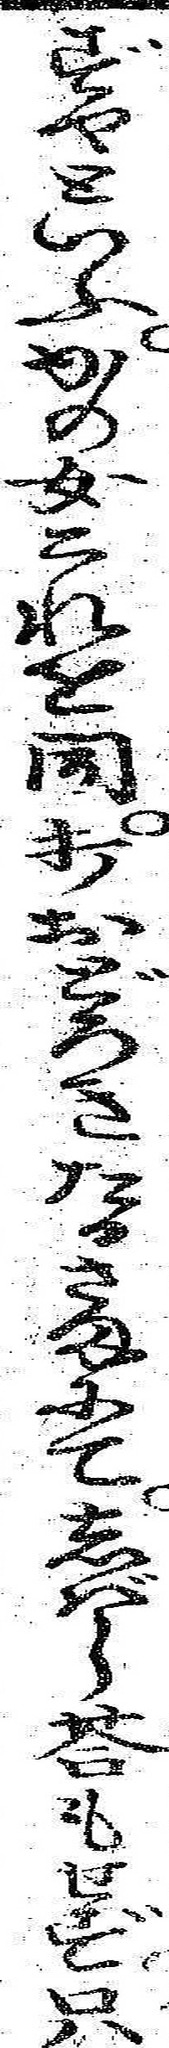ずやといふ。かの女これを聞。打おどろきたるさまにて。しばし荅もせず。只
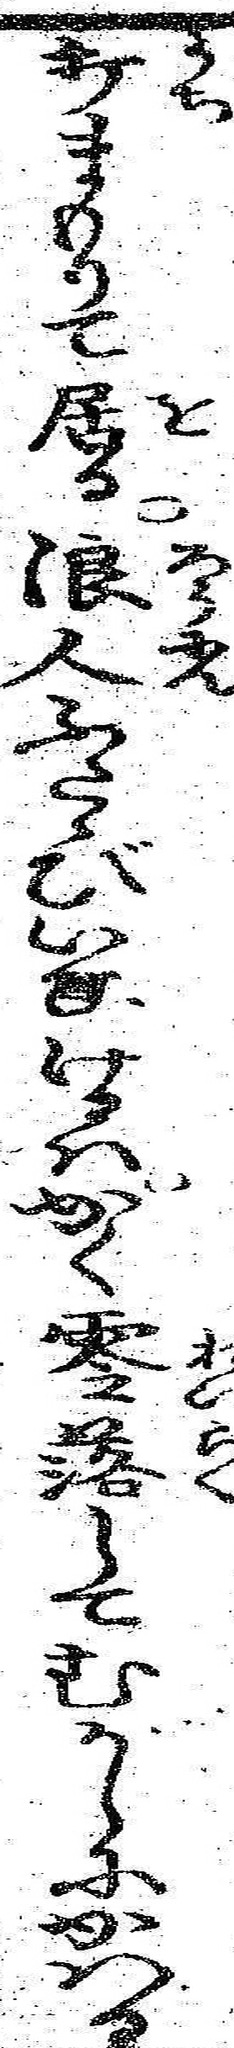打まもりて居る。浪人ふたゝびいひけるは。かく零落してむかしにかはる
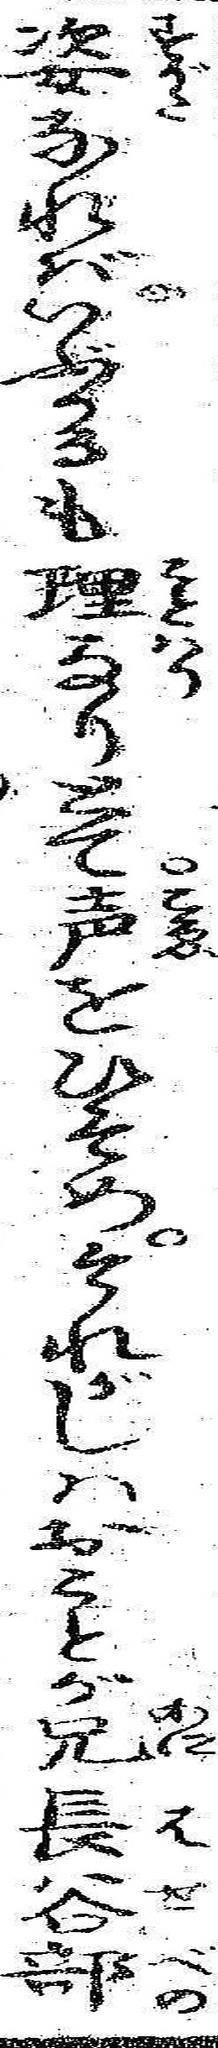姿なれば。いぶかるも理なりとて。声をひそめ。それがしはおことが兄長谷部
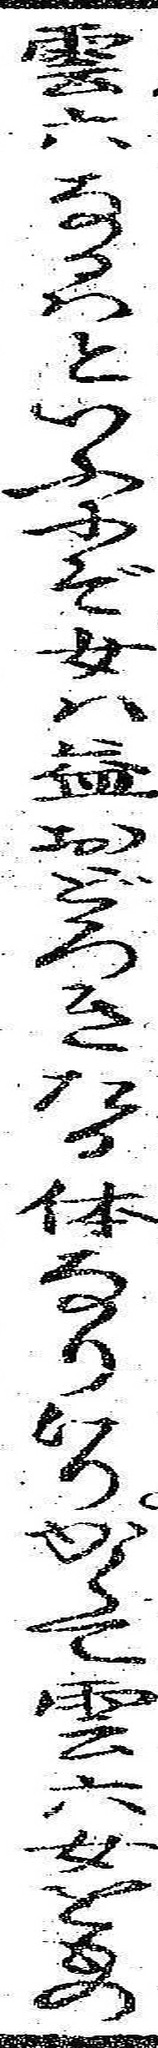雲六なるはといふにぞ。女は益おどろきたる体なりけり。かくて雲六女をもの
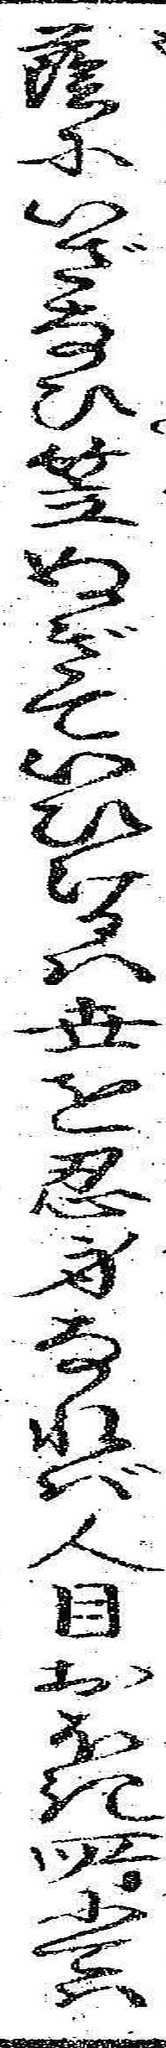蔭にいざなひ。笠ぬぎていひけるは。世を忍身なれば。人目おほき所にては
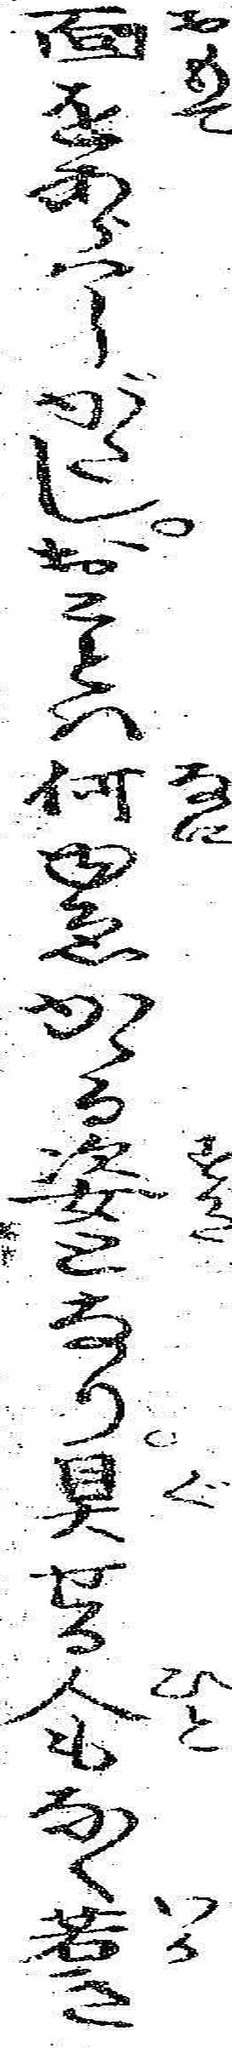面をあらはしがたし。おことは何ゆゑかゝる姿となり。具せる人もなく若き
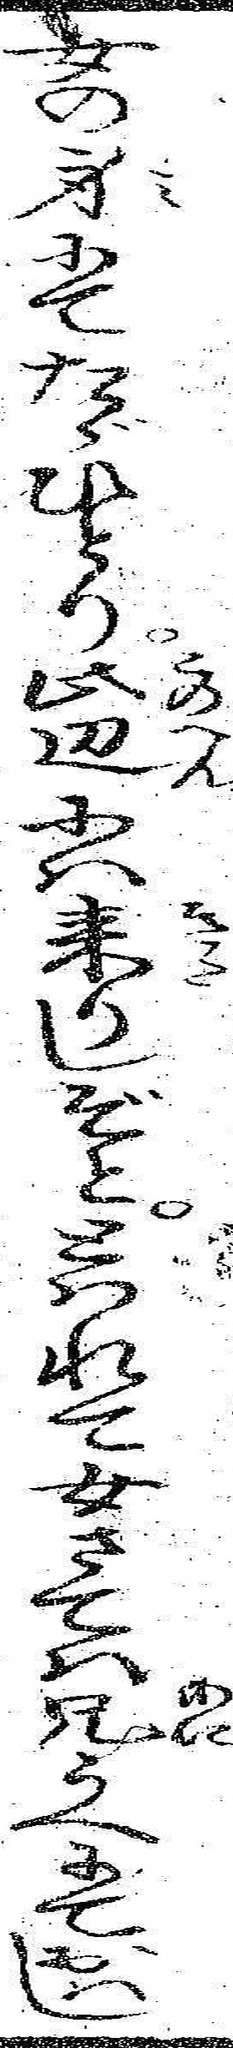女の身にてたゞひとり。此辺には来りしぞと。とはれて女さては兄うへにておはし
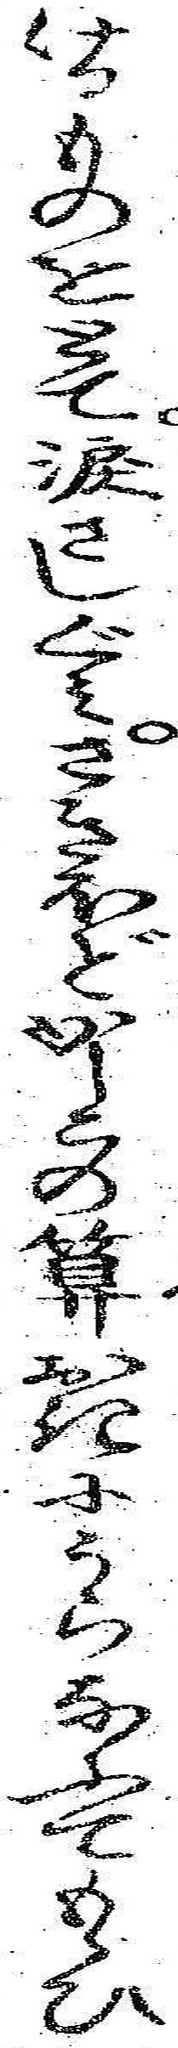けるものをとて。涙さしぐみ。さきほどかしこの算おきにうらなふてもららひ
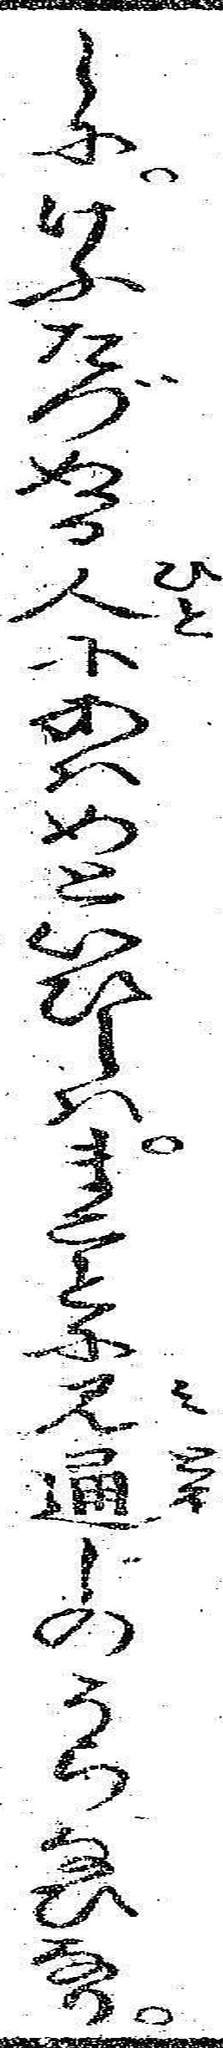しに。けふたづぬる人にあはめといひしは。まことに見通じのうらなひなり。
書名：昔話稲妻表紙
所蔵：国文学研究資料館
